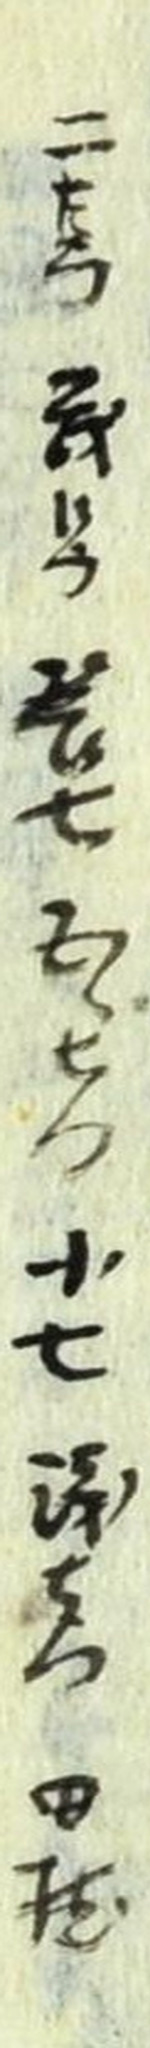二左衛門茂左衛門善七五郎右衛門小七浅右衛門田植
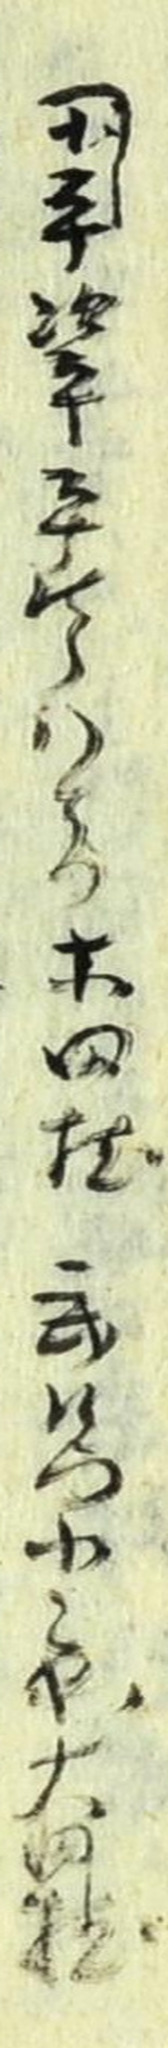│小平次平平次郎八左衛門等田植武左衛門小兵衛大田植
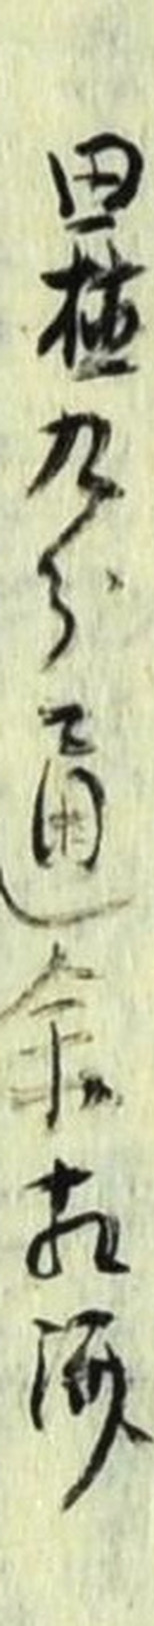田植九分通余相済
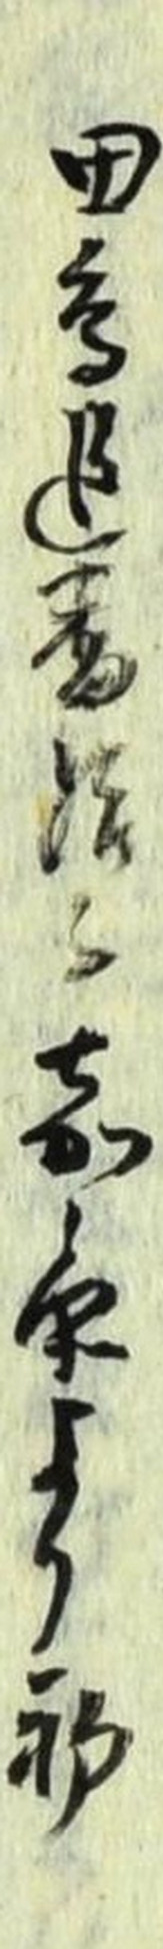田鳥追番始る嘉兵衛より初
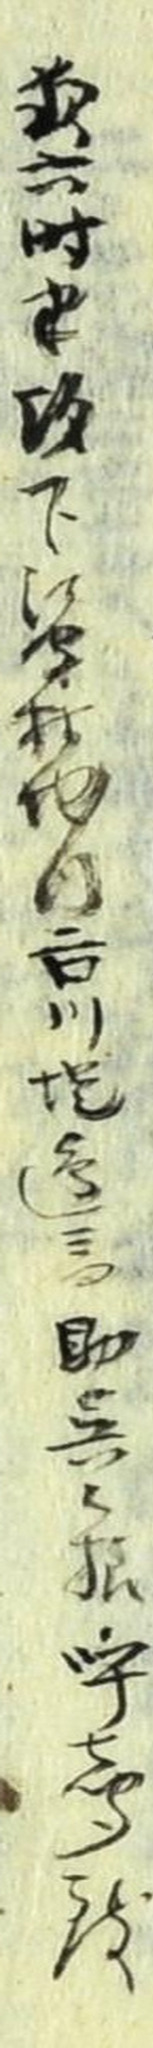夜六時半頃下江守村地内二口川堤辺ニ而助呉候様呼声致
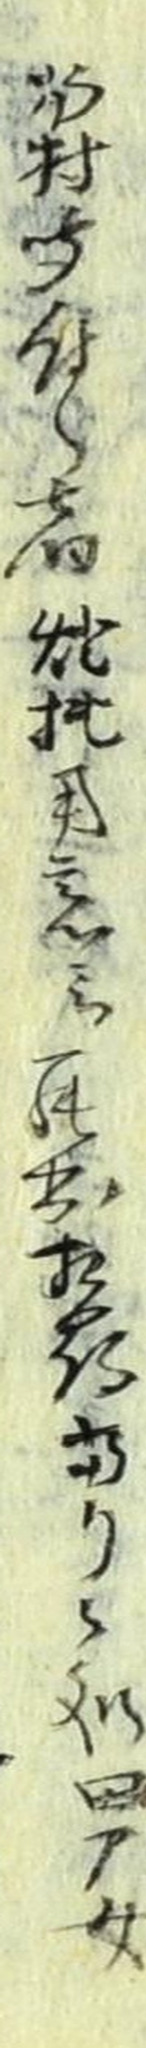当村聞付候者灯提用意ニ而罷出相尋当リ候処田中女
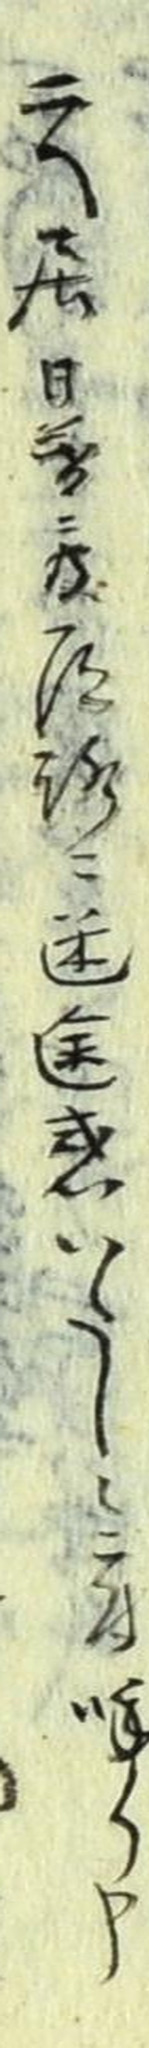二人居日暮ニ及道路ニ迷途惑いたし候ニ付呼り申
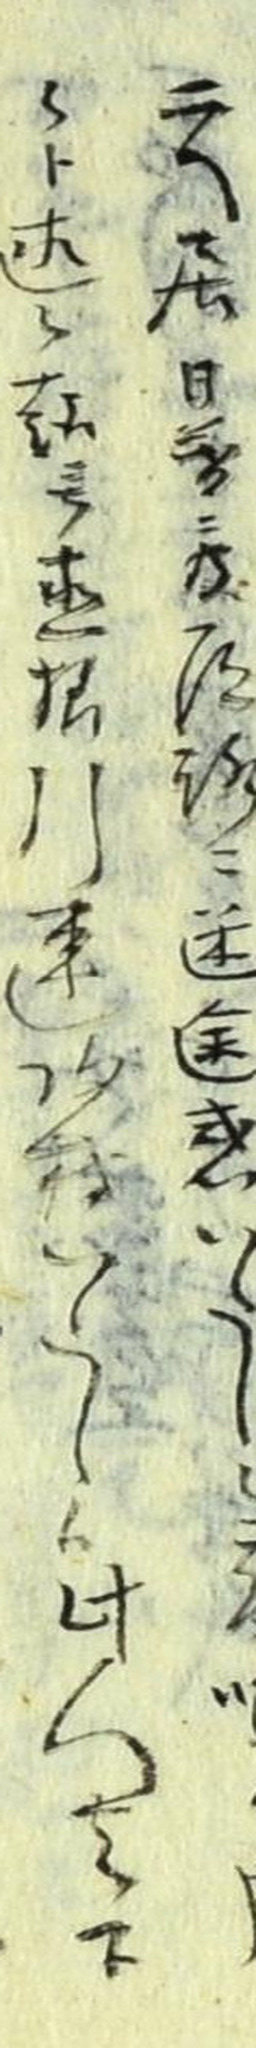候ト述候趣ニ而直様引連帰村いたし候此人者下
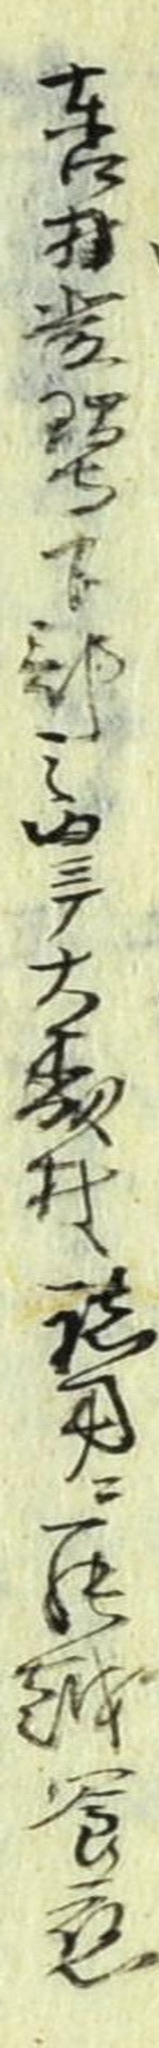東郷村厳瑞寺下部之由ニテ大森村へ諸用ニ罷越饗応
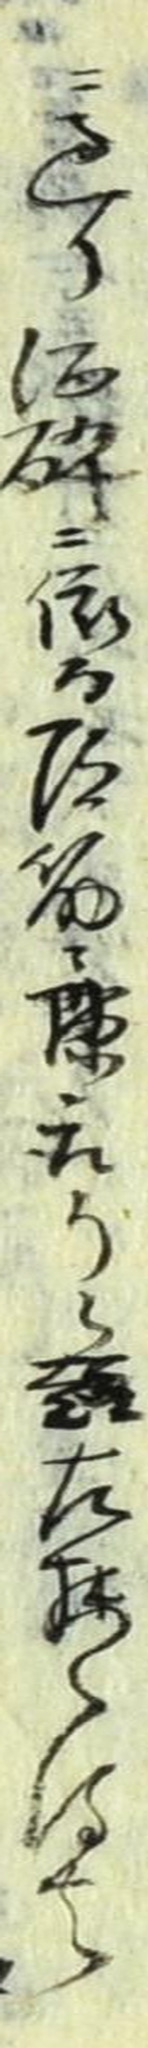ニ過り酒砕ニ依而道筋ニ隙取り候趣左様候得者
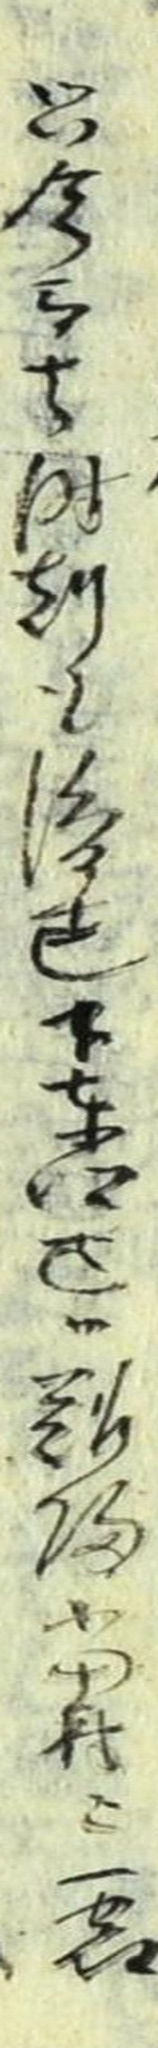只今ニ而者時刻も後れ下東郷迄ハ難帰当村ニ一宿
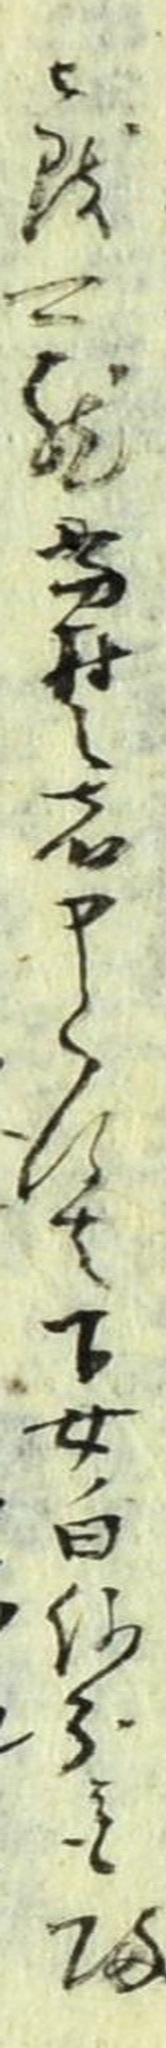被致可然当村之者申候得者下女ノ曰何分ニも帰
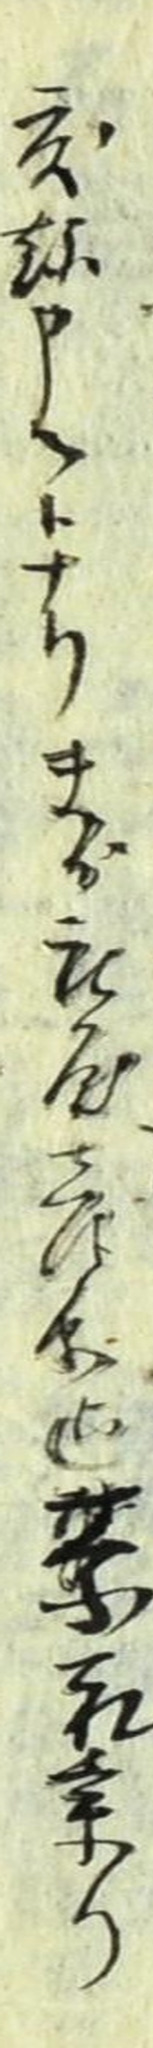度趣申候トナリ夫ゟ庄屋彦兵衛迄某つれ参り
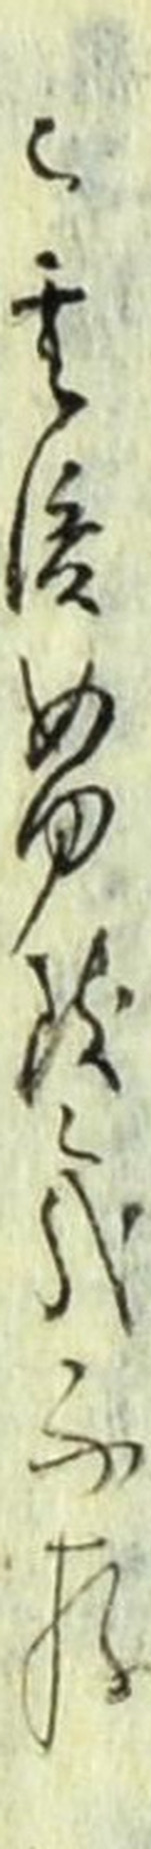候其後如何致候哉不存
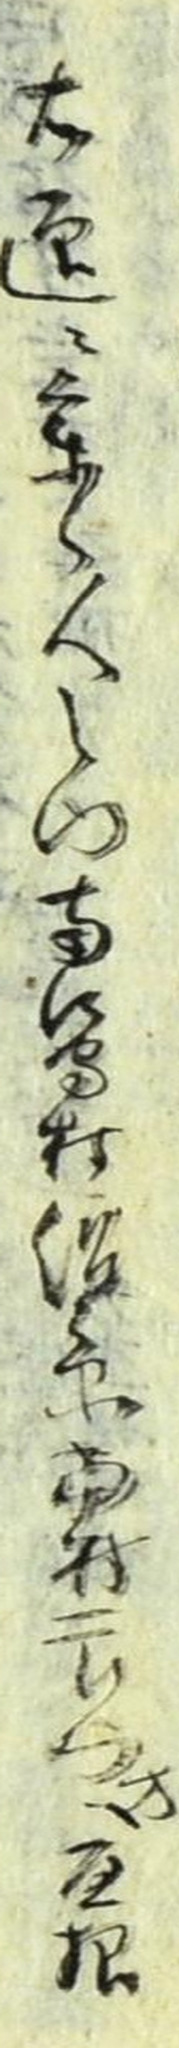右迎ニ参候人之内南江守村作兵衛当村二左衛門方へ屋根
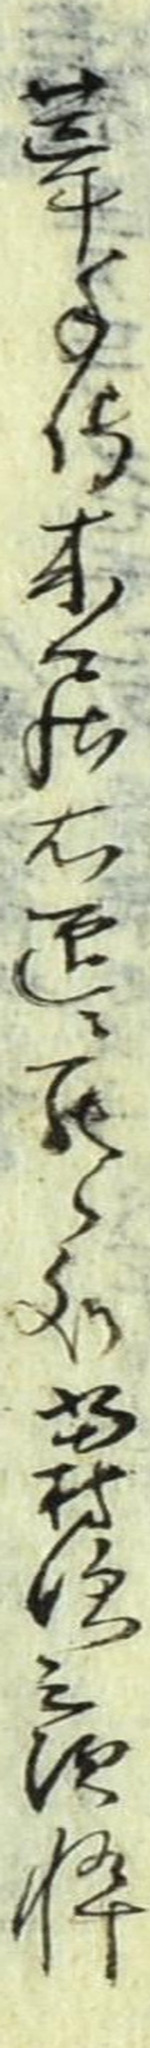葺手伝来居右迎ニ罷候処当村次三次倅
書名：（日記）
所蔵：福井県文書館 Fukui Prefectural Archives
